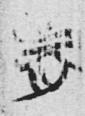前
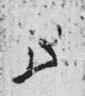之
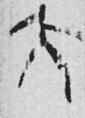大（太）
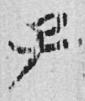子
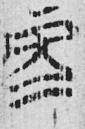再
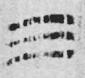三
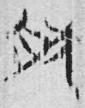肰（然）
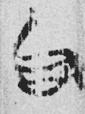句（後）
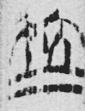竝
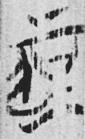聖（聽）
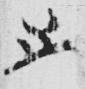之
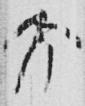大（太）
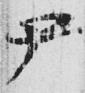子
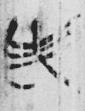母
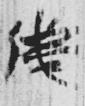俤（弟）
